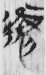○（彪）
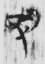受
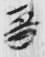○（期）
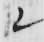乙
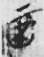梄（酉）
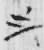之
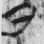日
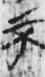不
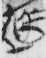𬨭（將）
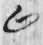㠯（以）
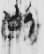○（廷）
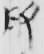阩
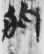門
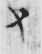又
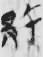敗
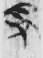○（得）
